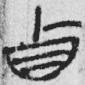貞
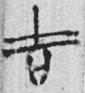吉
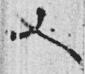又
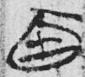卣（攸）
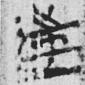往
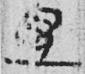見
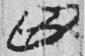凶
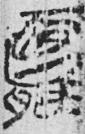○（羸）
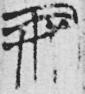豕
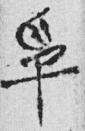孚
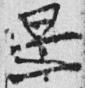是
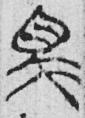蜀（獨）
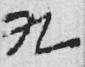九
